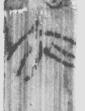亦
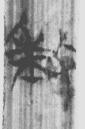殺
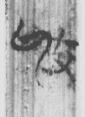收
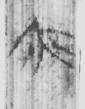亦
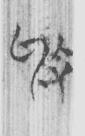收
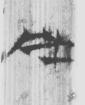凡
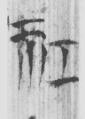{示工}
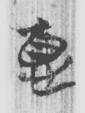惪
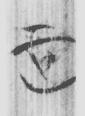正
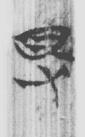𠭁
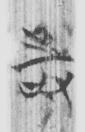𠱾
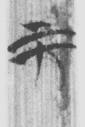而
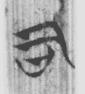司
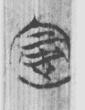{宀帝止}
